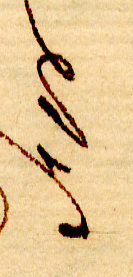For
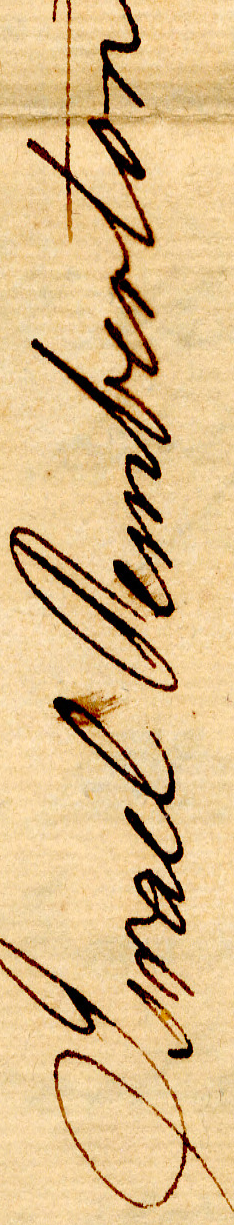Israel Pemberton
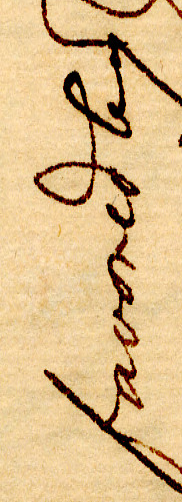favored by
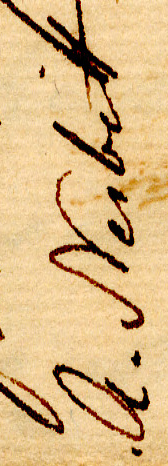A. Nesbitt
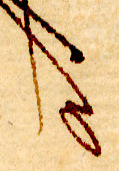at
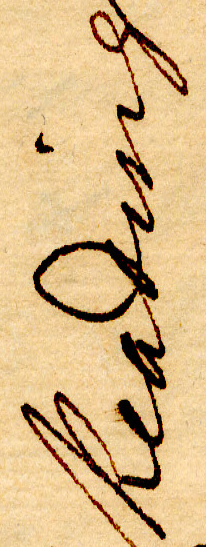Reading
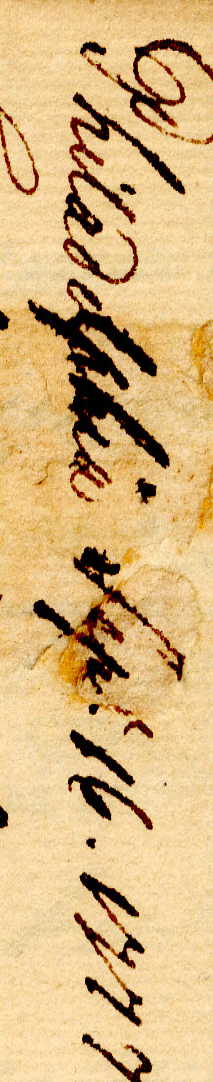Philadelphia Sep^r. 16. 1777
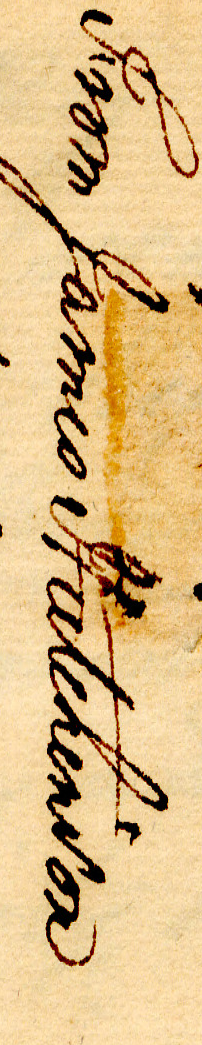from James Hutchinson
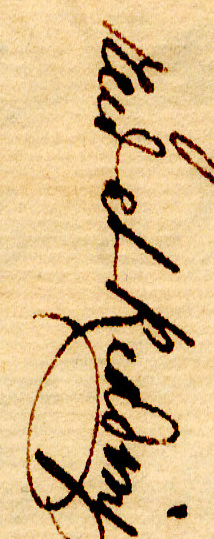recd at Reading.
